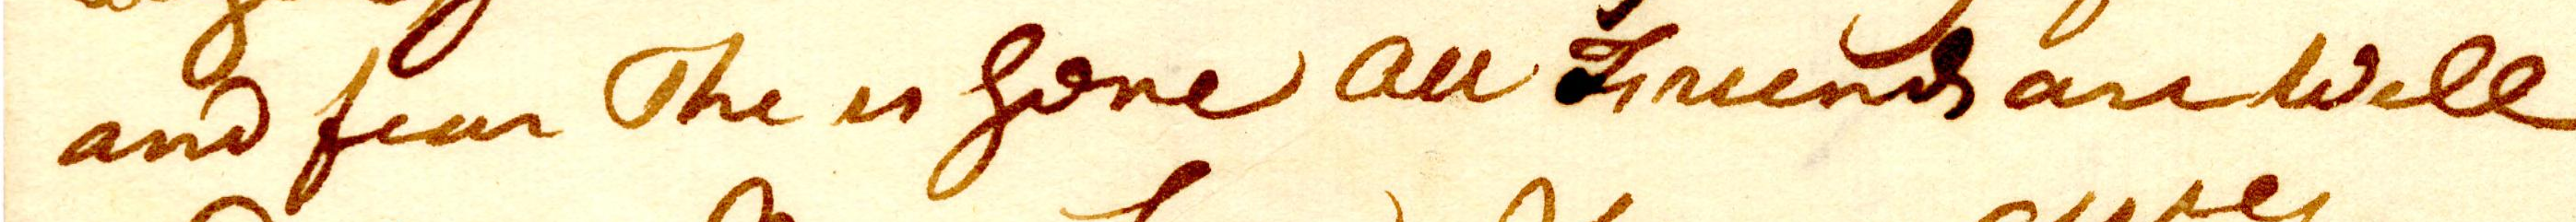and fear she is Gone all Friends are Well
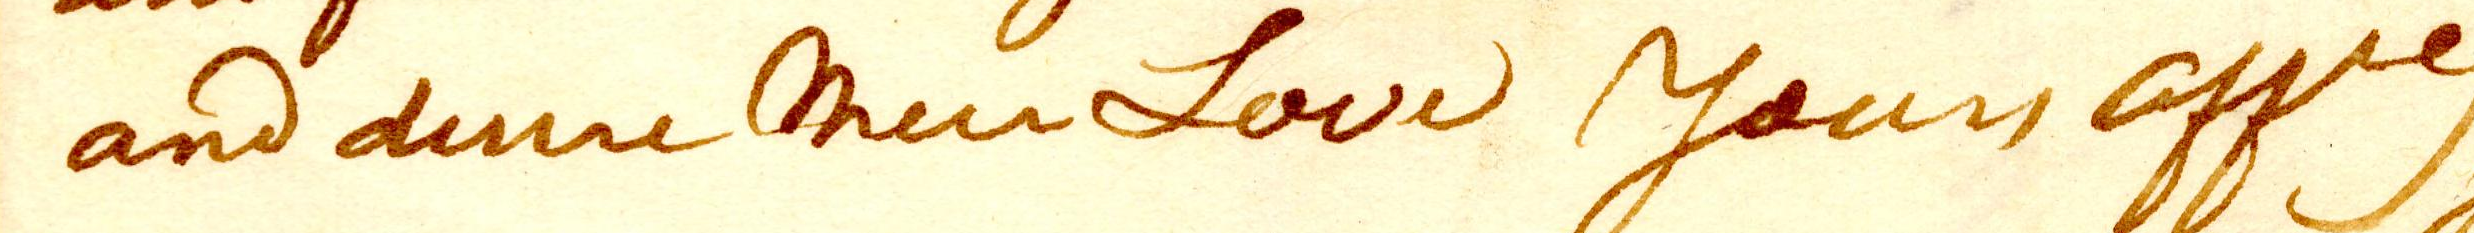and desire their Love yours aff^te
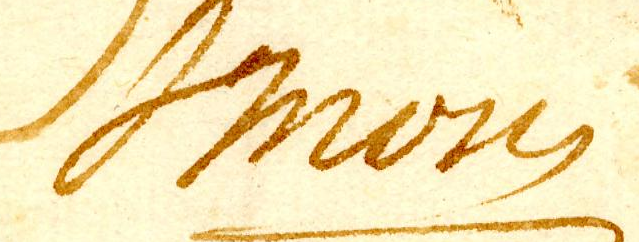I^c Moses
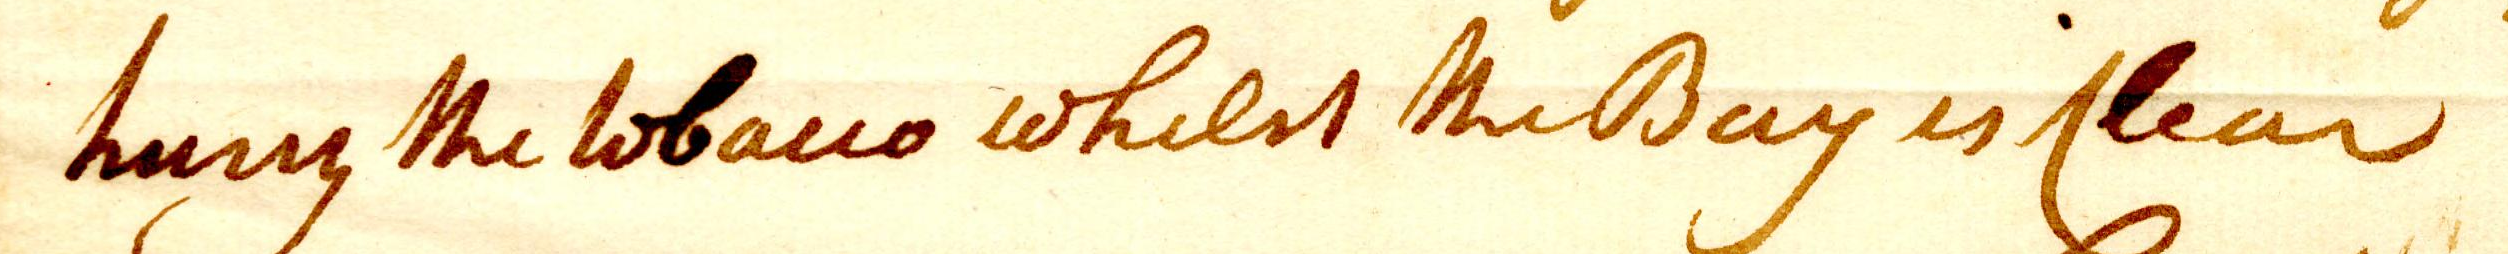hurry the tobacco whiles the Bay is clear
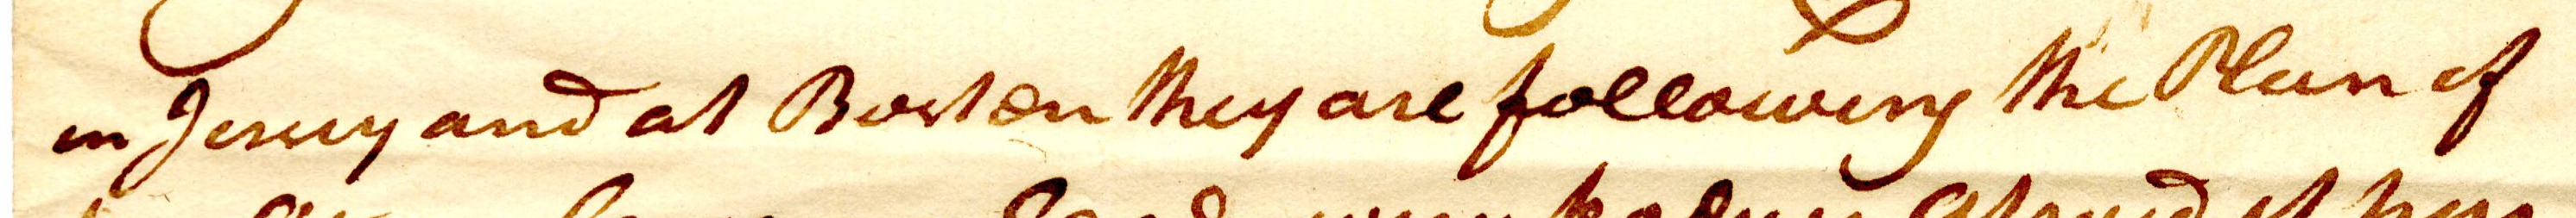in Jersey and at Boston they are following the Plan of
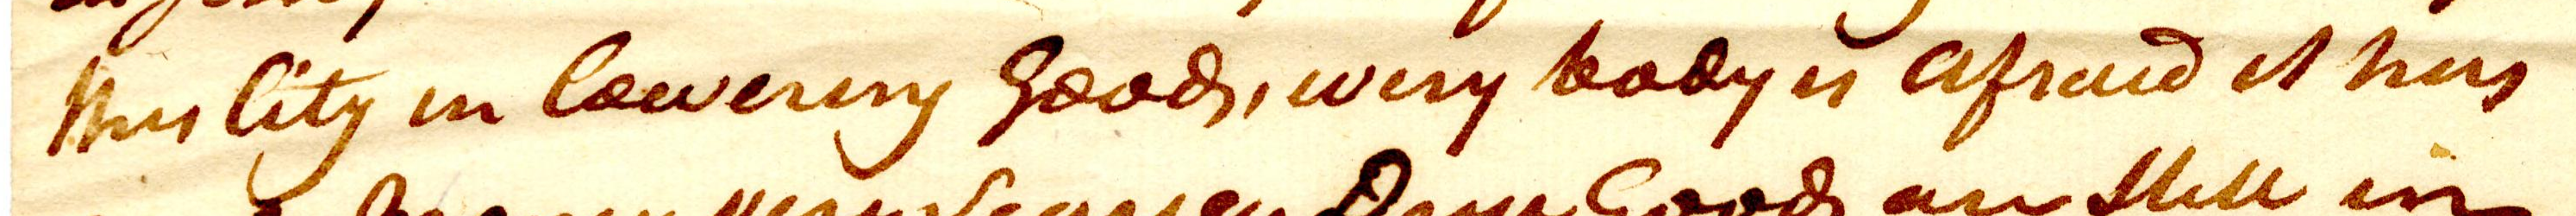this city in Cowering goods, every body is afraid it has
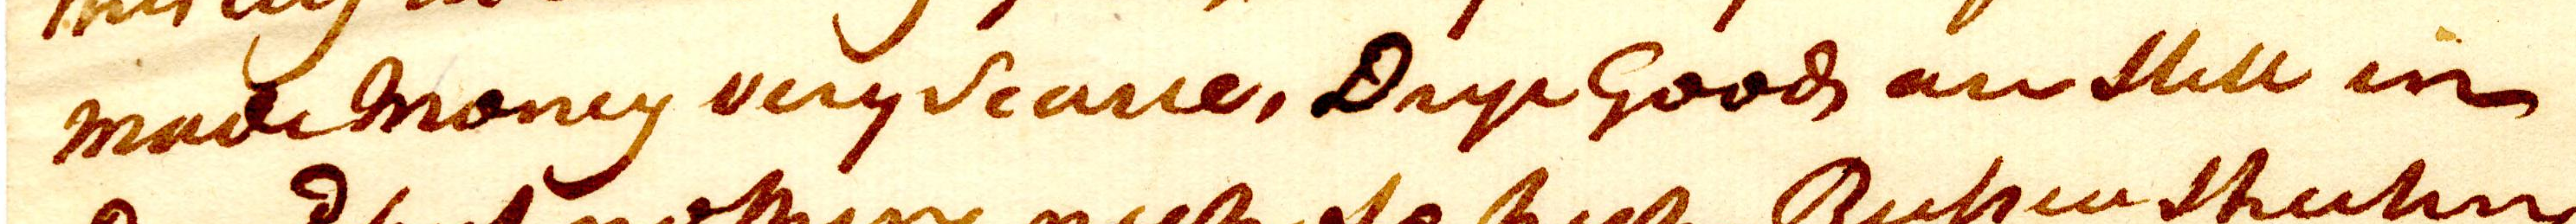made money very Scarce, Drye goods an still in
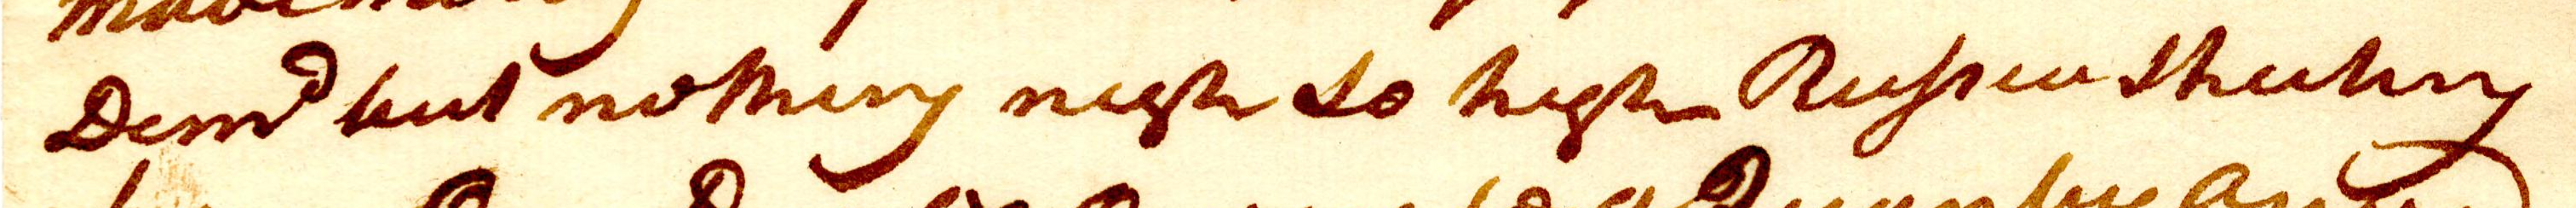Dem^d but notthing nigh so high Rushes shaky
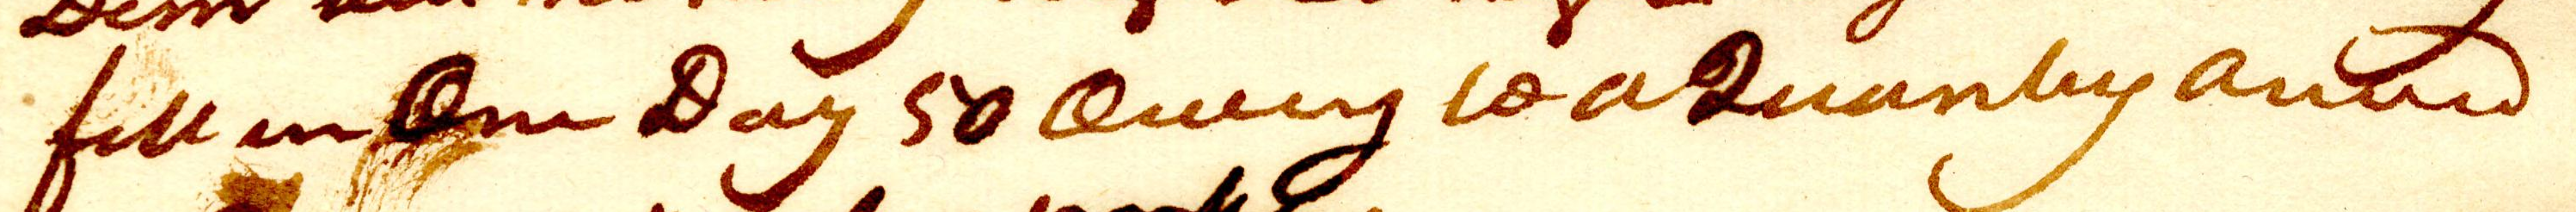fill in one Day 50 Ounces 10 a Quanty asked
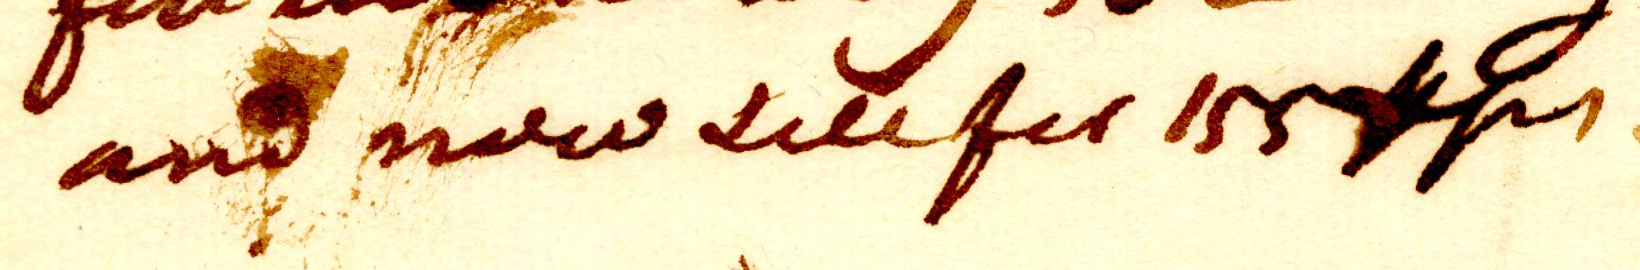and now suffer 155 pp
